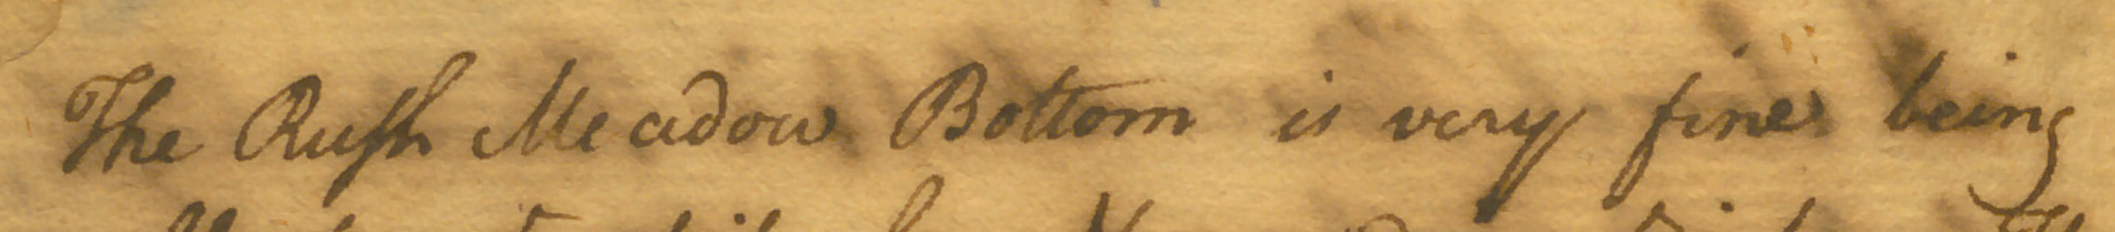The Rush Meadow Bottom is very fine being
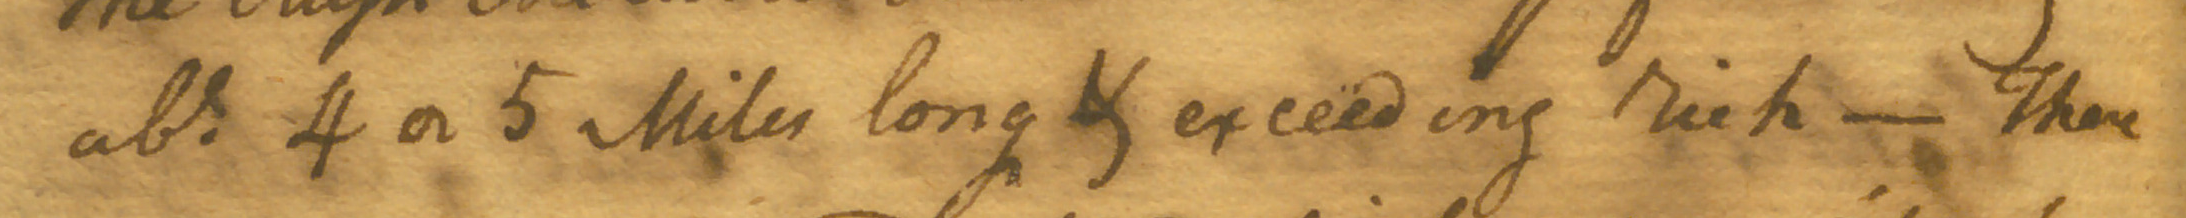ab^t. 4 or 5 Miles long & exceeding rich- There
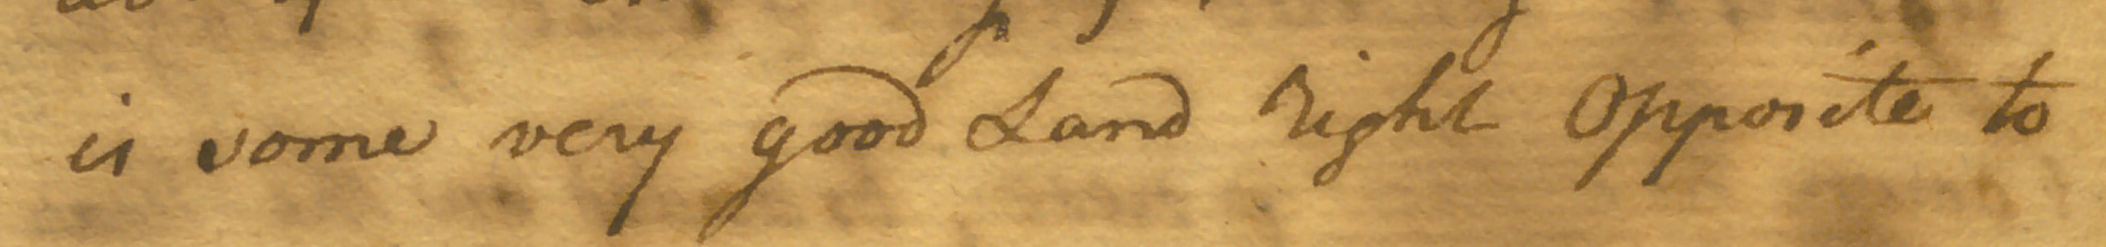is some very good Land right opposite to
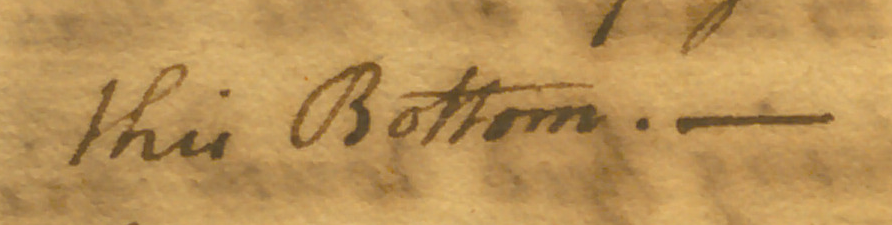this Bottom.-
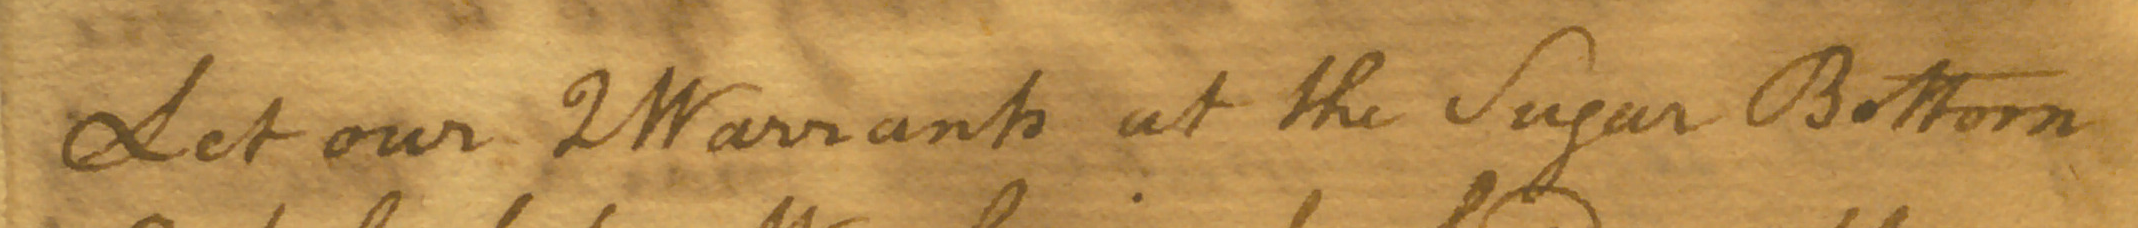Let our 2 Warrants at the Sugar Bottom
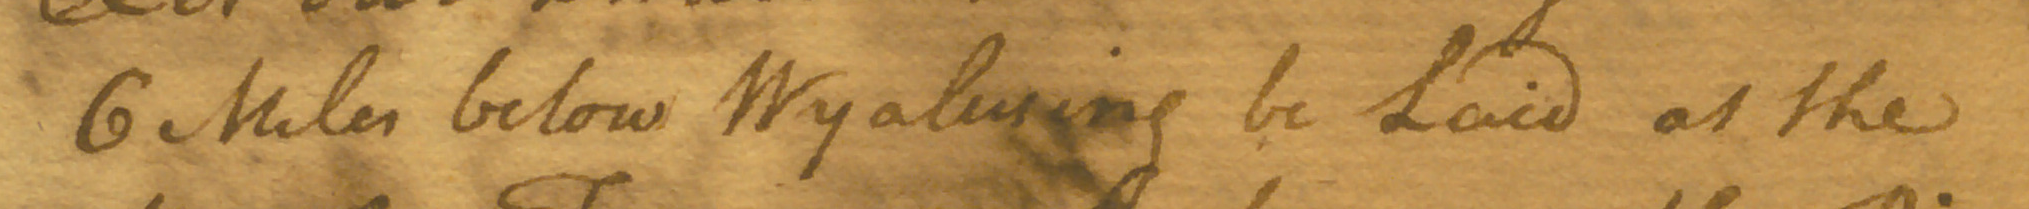6 Miles below Wyalusing be Laid at the
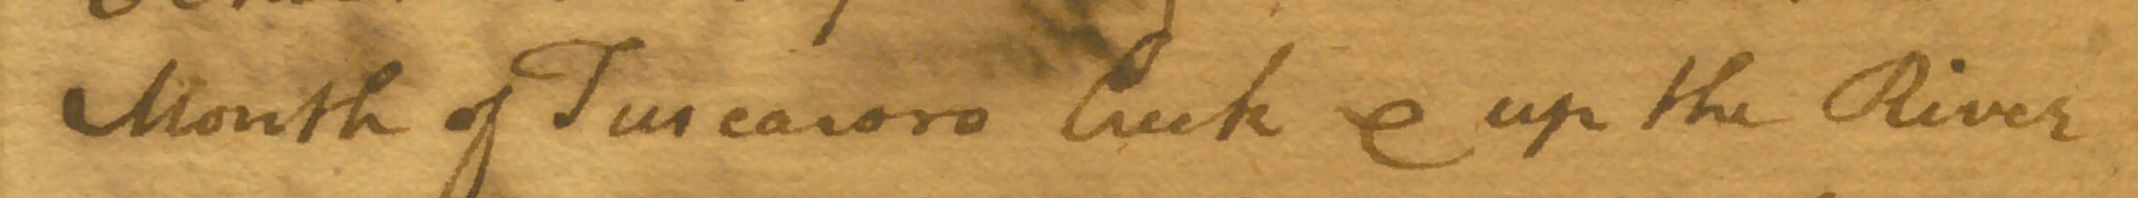Mouth of Tuscaroro Creek & up the River
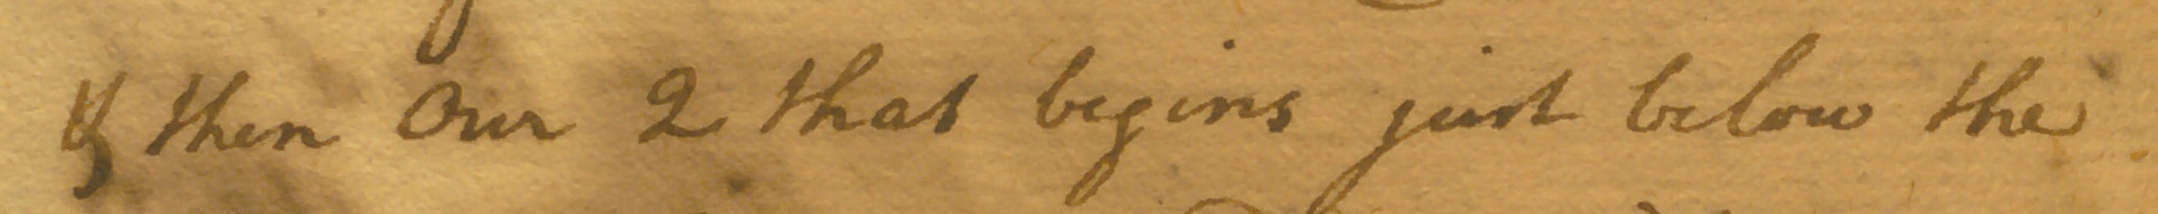& then our 2 that begins just below the
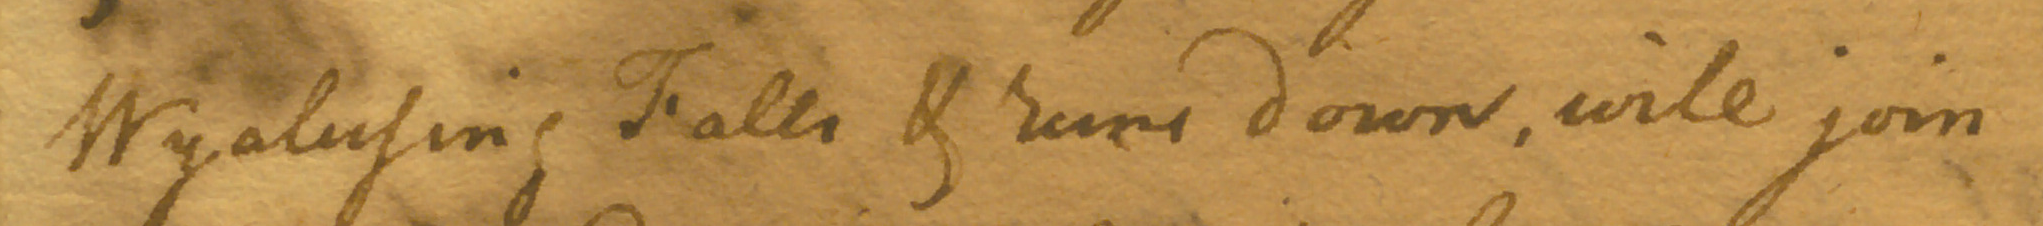Wyalusing Falls & runs down, will join
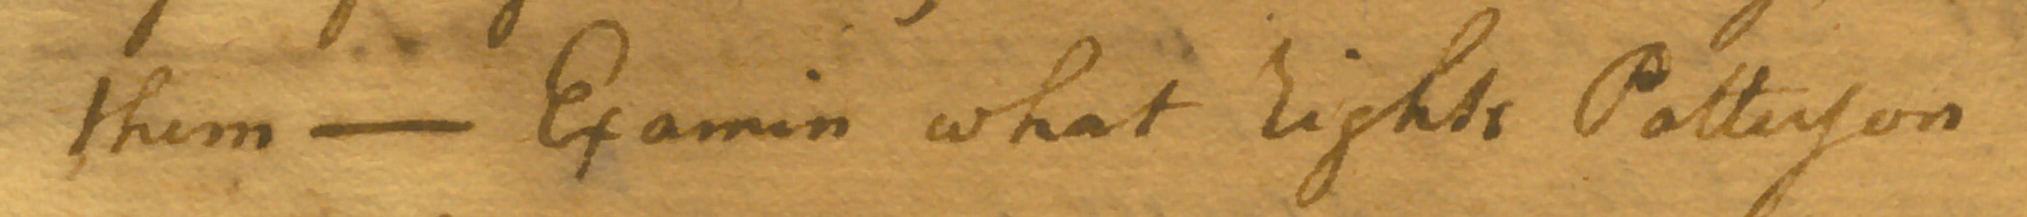them- Examin what rights Patterson
